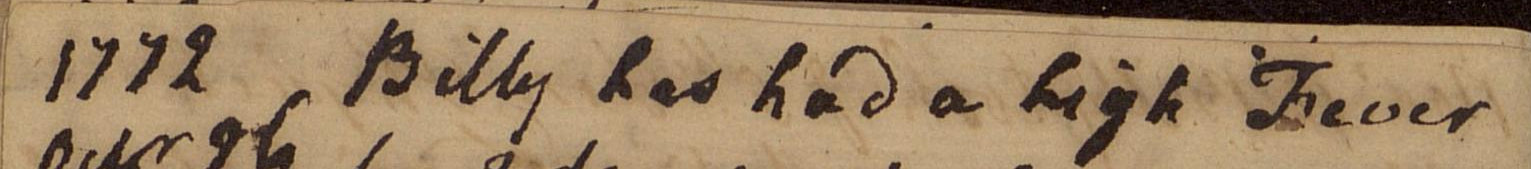1772 Billy has had a high Fever
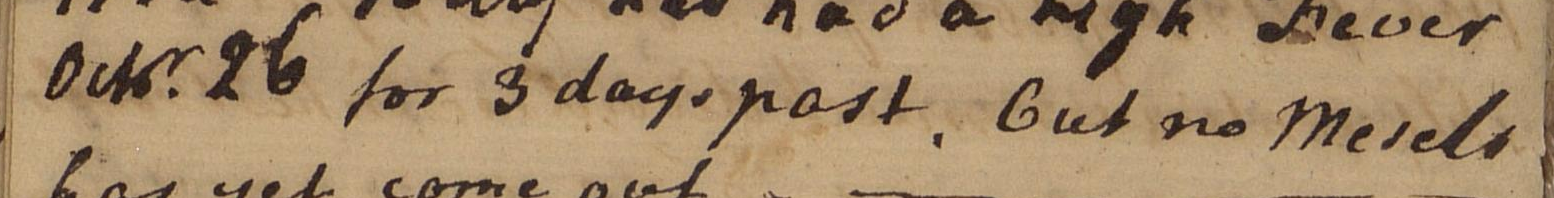Octo^r. 26 for 3 days past, but no Mesels
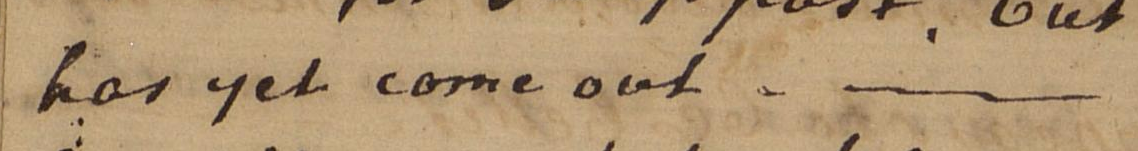has yet come out-
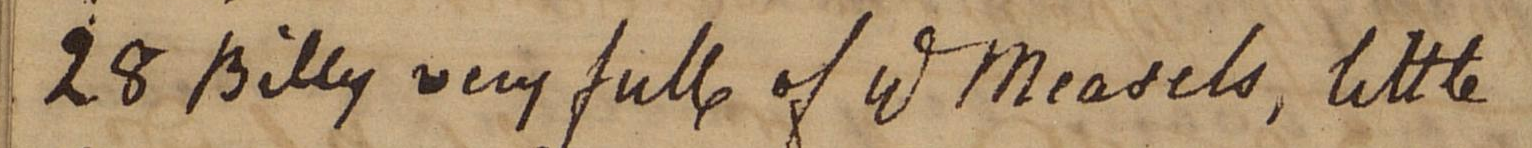28 Billy very full of y^e Measels, little
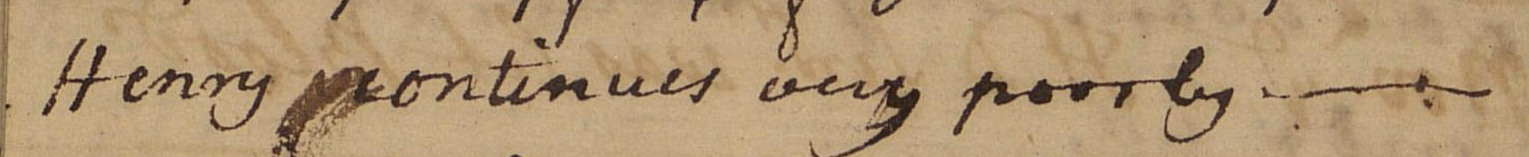Henry continues very poorly.-
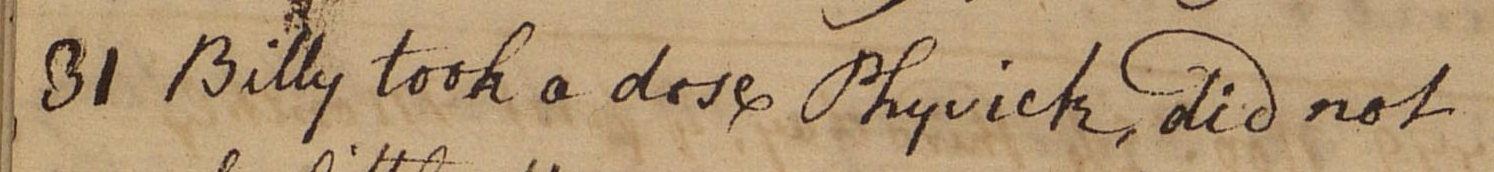31 Billy took a dose Physick, did not
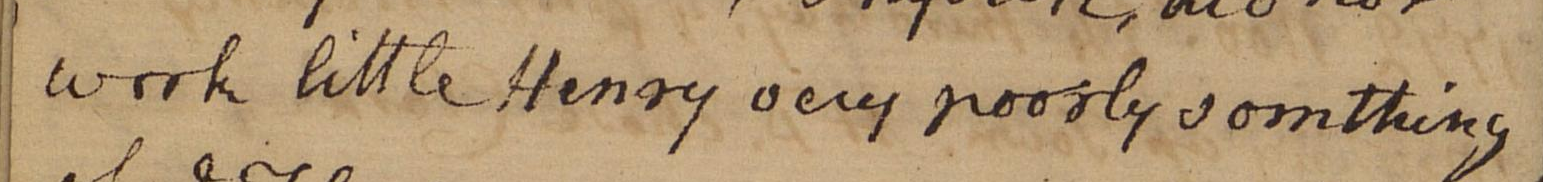work little Henry very poorly somthing
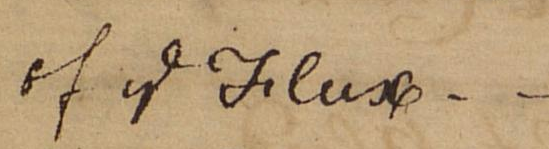of y^e Flux-
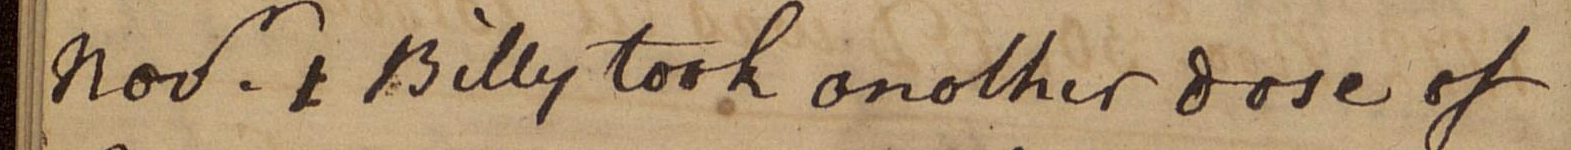Nov^r. 1 Billy took another dose of
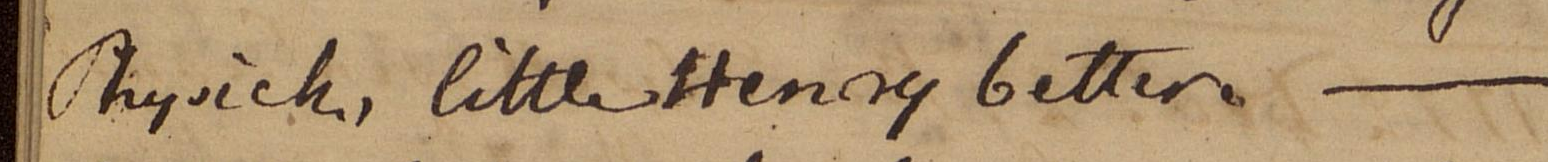Physick, little Henry better.-
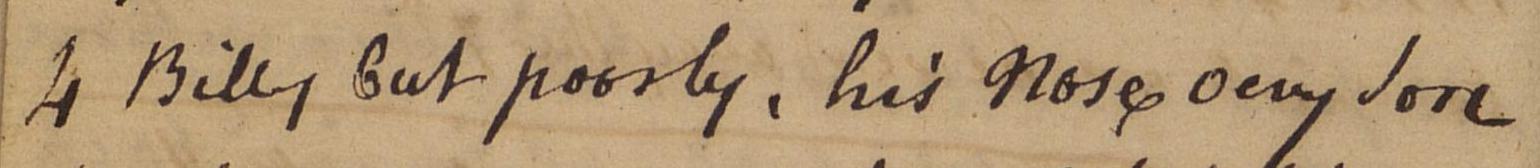4 Billy but poorly, his Nose very Sore
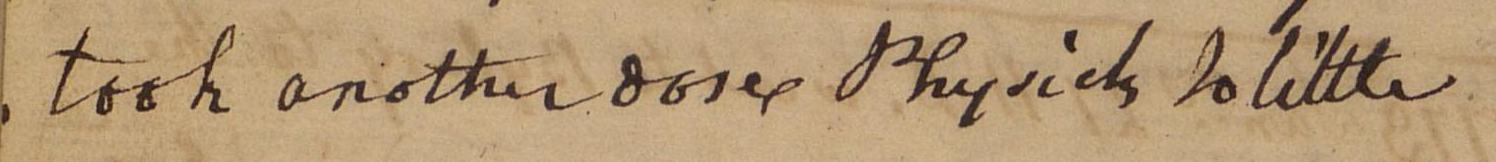took another dose Physick to little
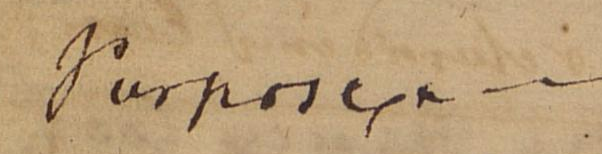Purposes-
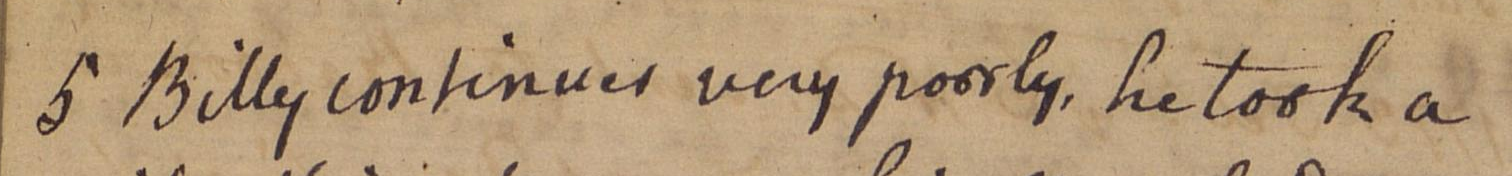5 Billy continues very poorly, he took a
